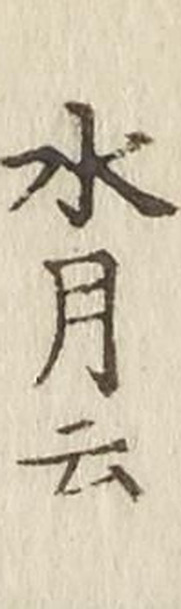水月云
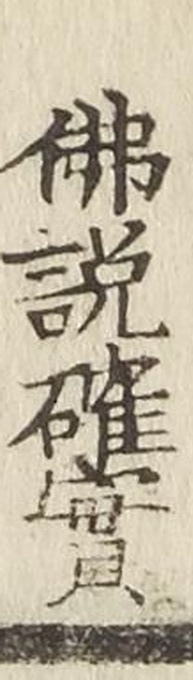仏説確実
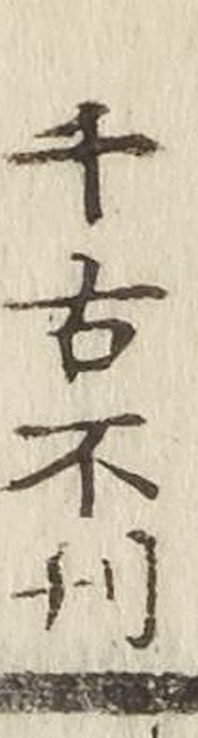千古不利
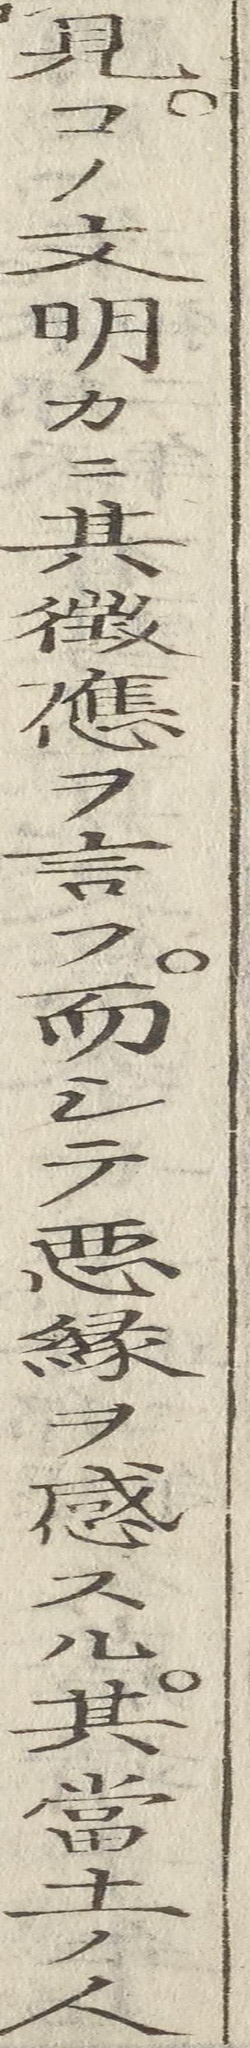見。コノ文明カニ其徴応ヲ言フ。而シテ悪縁ヲ感スル。其当土ノ人
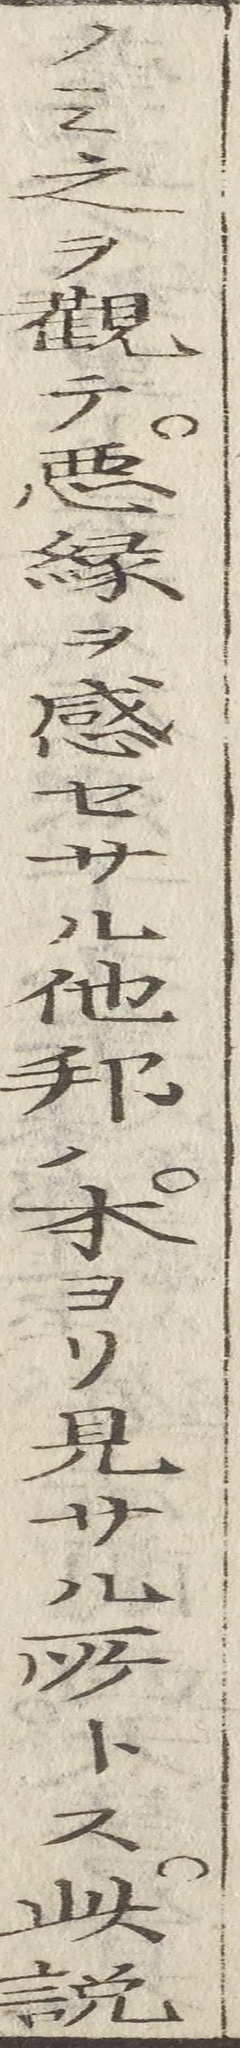ノミ之ヲ観テ。悪縁ヲ感セサル他邦ノ。本ヨリ見サル所トス。此説
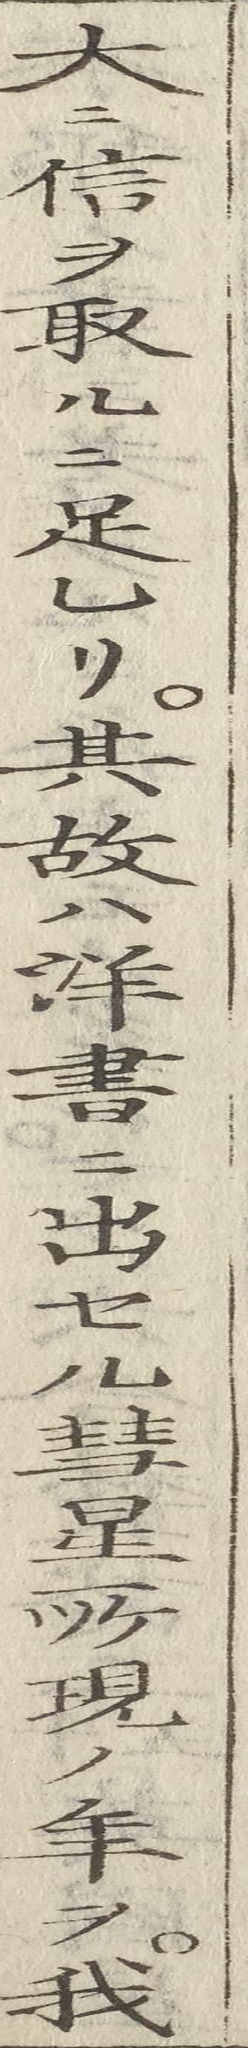大ニ信ヲ取ルニ足レリ。其故ハ洋書ニ出セル彗星所現ノ年ヲ。我

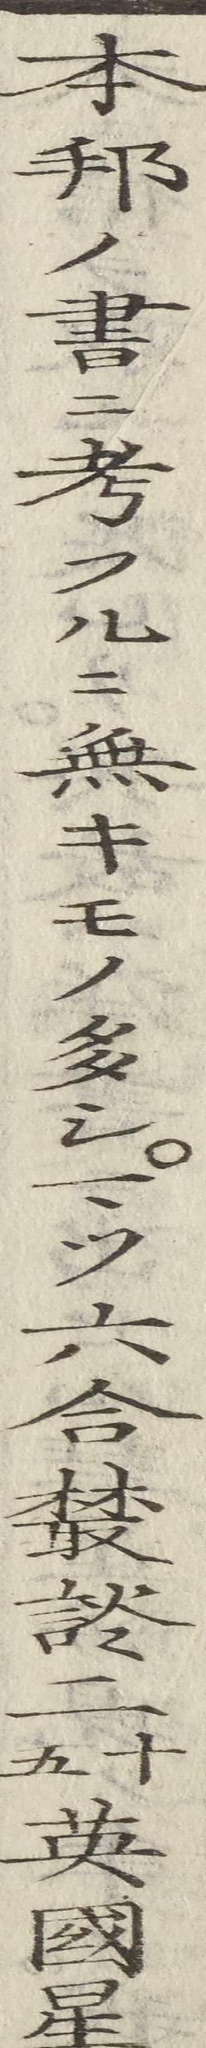本邦ノ書ニ考フルニ無キモノ多シ。マツ六合樷談ニ十五英国星
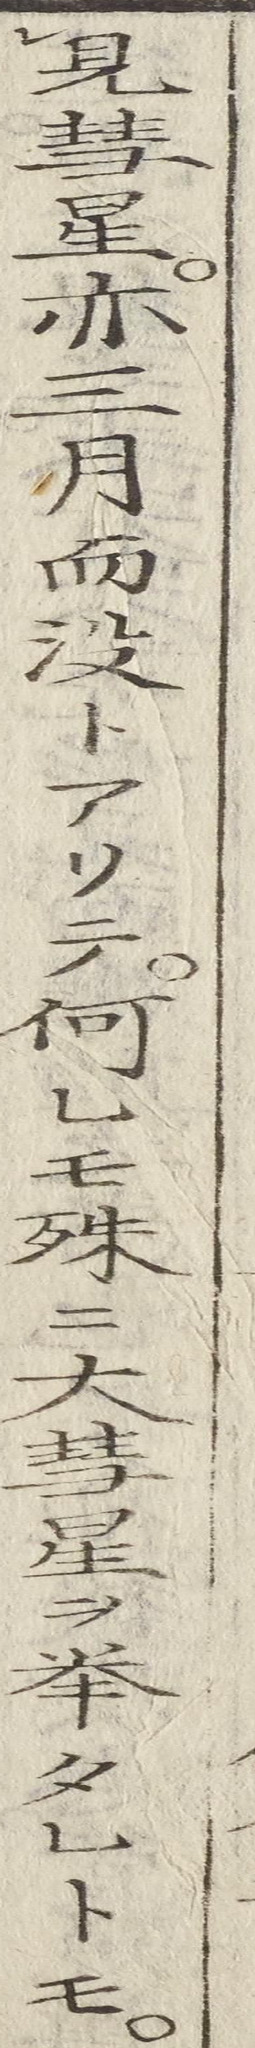見彗星。亦三月而没トアリテ。何レモ殊ニ大彗星ヲ挙タレトモ。
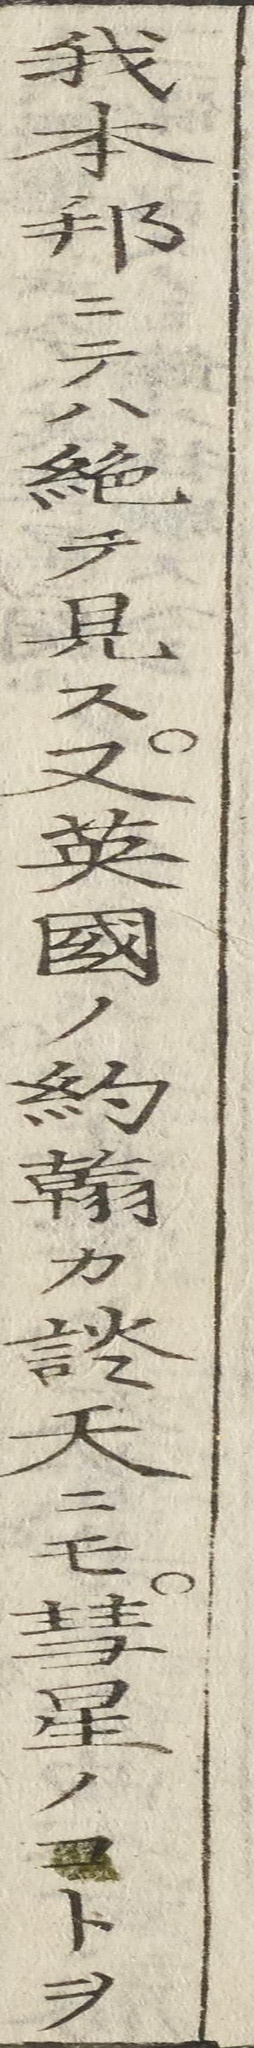我本邦ニテハ絶テ見ス。又英国ノ約翰カ談天ニモ。彗星ノコトヲ
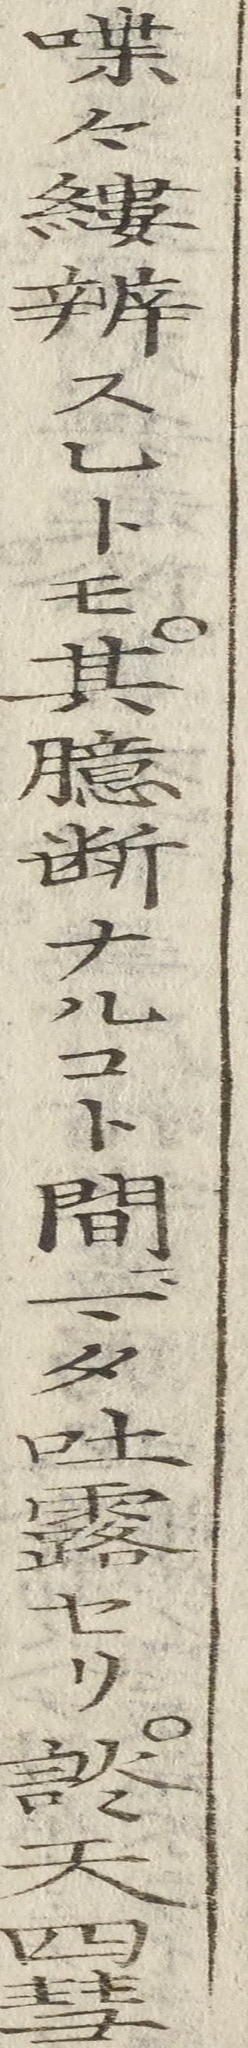喋々縷弁スレトモ。其臆断ナルコト間吐露セリ。談天四彗
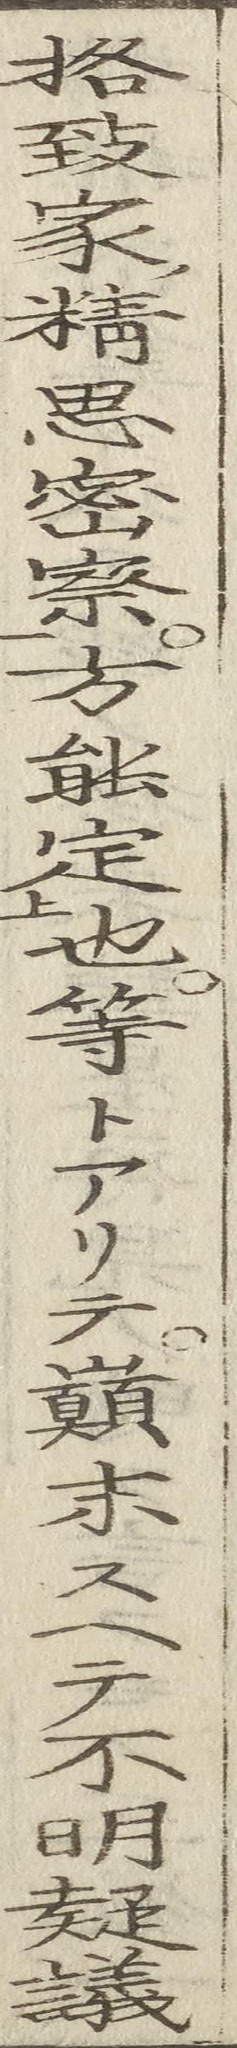格致家精思密察。方能定也。等トアリテ。顛末スヘテ不明疑議
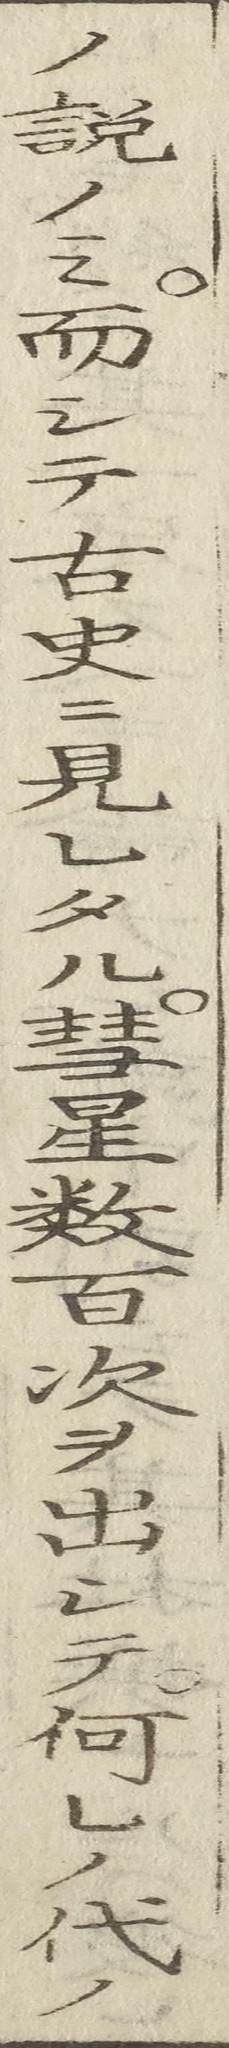ノ説ノミ。而シテ古史ニ見レタル。彗星数百次ヲ出シテ。何レノ代ノ
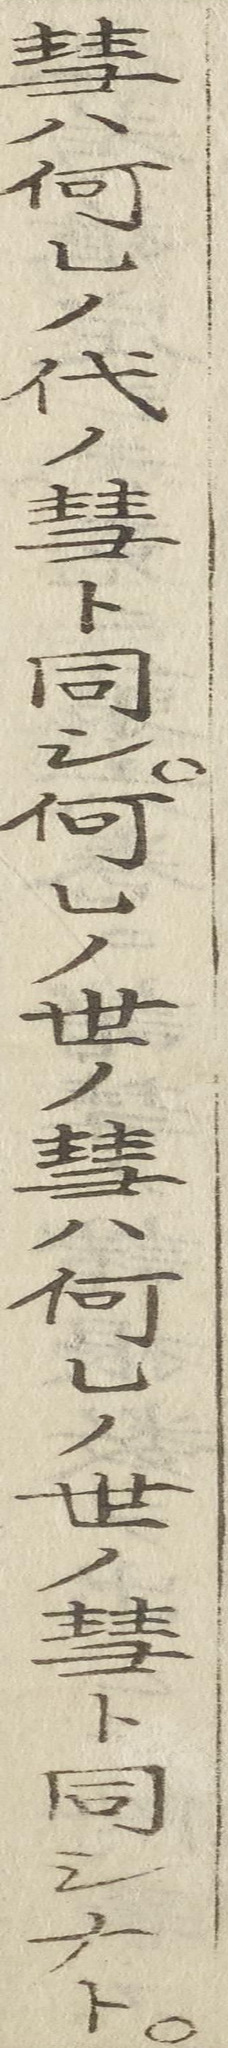彗ハ何レノ代ノ彗ト同シ。何レノ世ノ彗ハ何レノ世ノ彗ト同シナト。

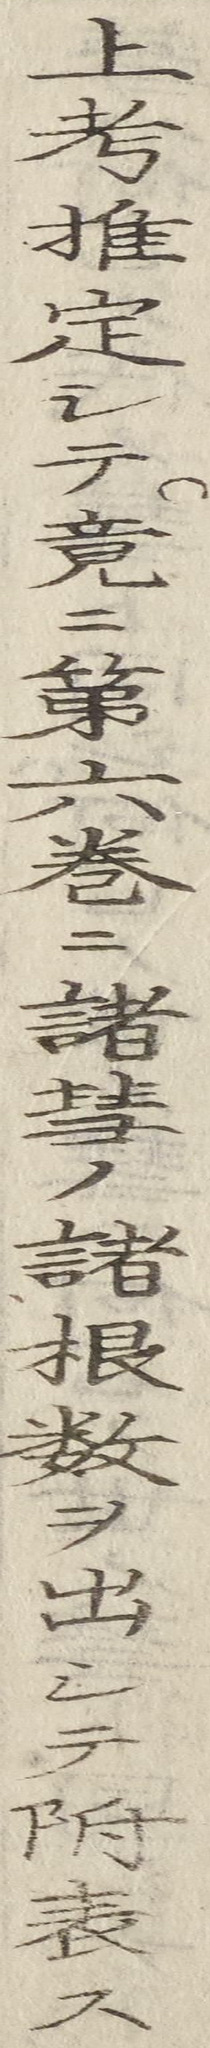上考推定シテ。竟ニ第六巻ニ諸彗ノ諸根数ヲ出シテ付表ス
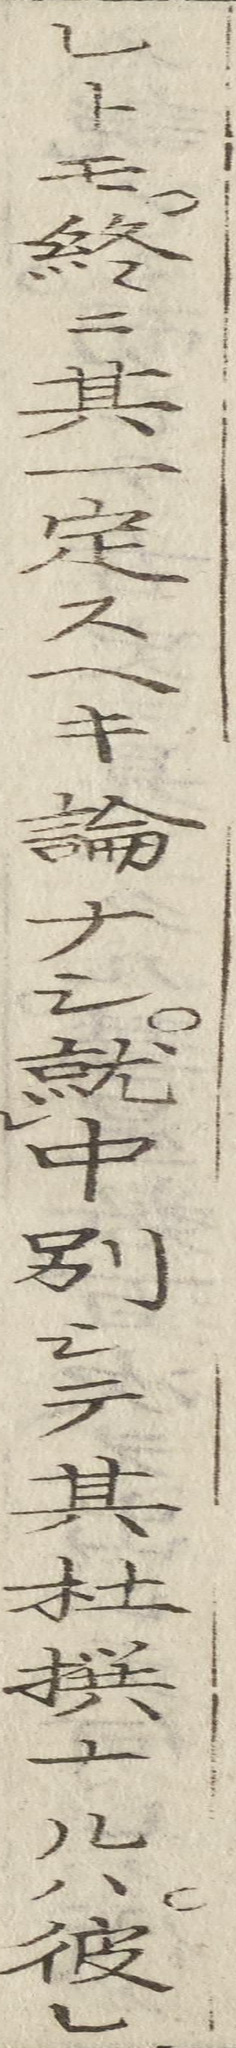レトモ。終ニ其一定スヘキ論ナシ。就中別シテ其杜撰ナルハ。彼レ
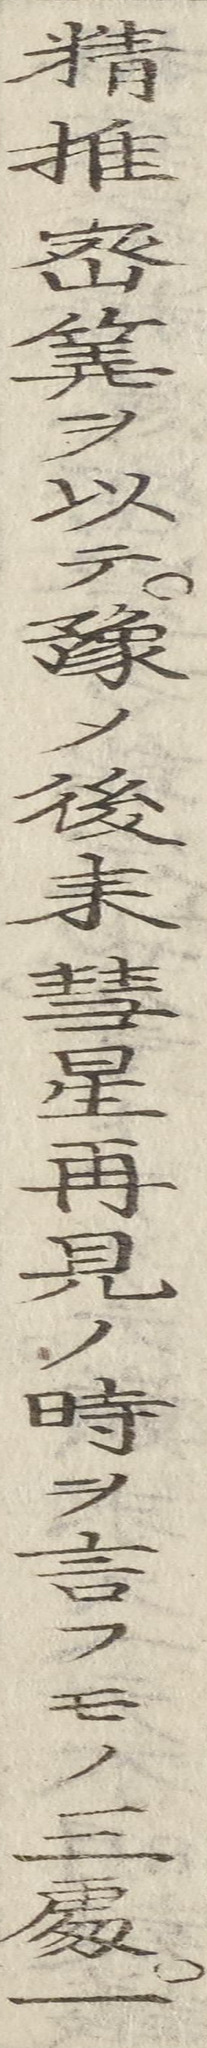精推密算ヲ以テ。予メ後来彗星再見ノ時ヲ言フモノ三処。一
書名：護法新論　中
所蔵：東京大学地震研究所図書室 Earthquake Research Institute Library, The University of Tokyo, JAPAN
